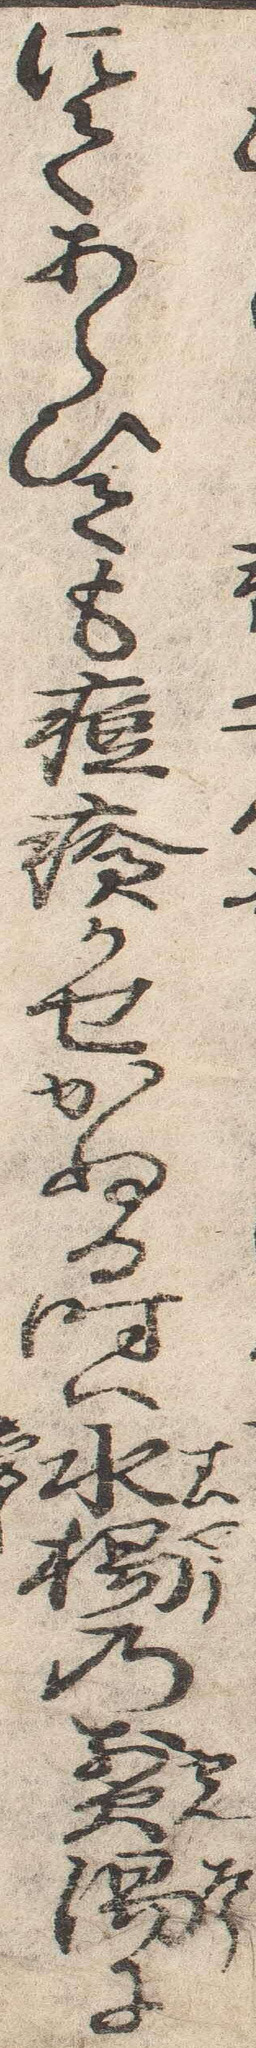にてあらひても痘瘡かせかぬる時は水楊の煎湯に
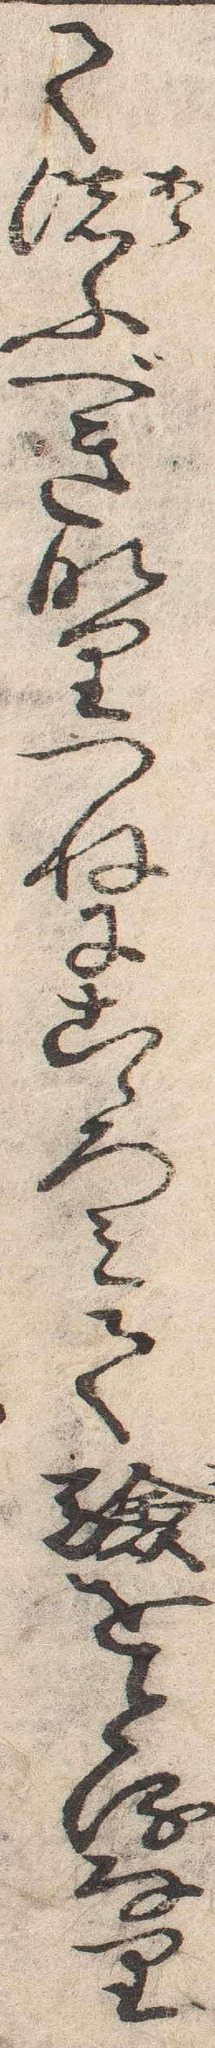て洗ふべきなりつねにこゝろみて験をとるなり
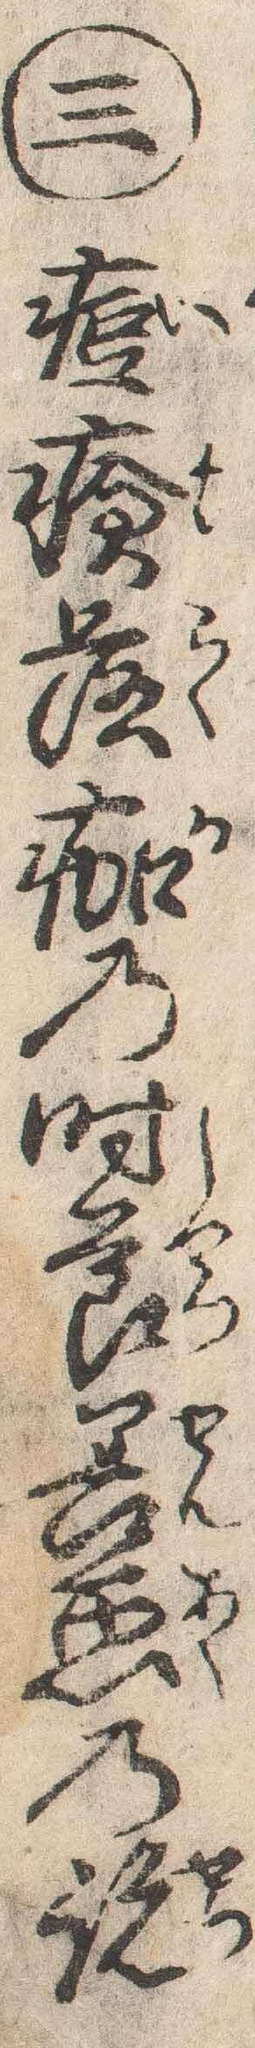㊂痘瘡落痂の時節善悪の説

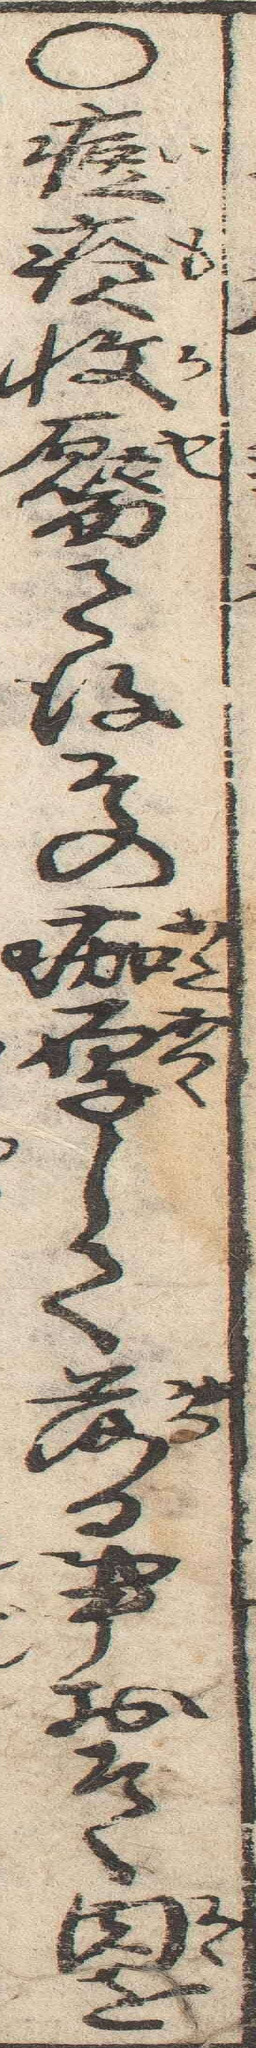○痘瘡収靨て後その痂厚して落る事おそく肉を
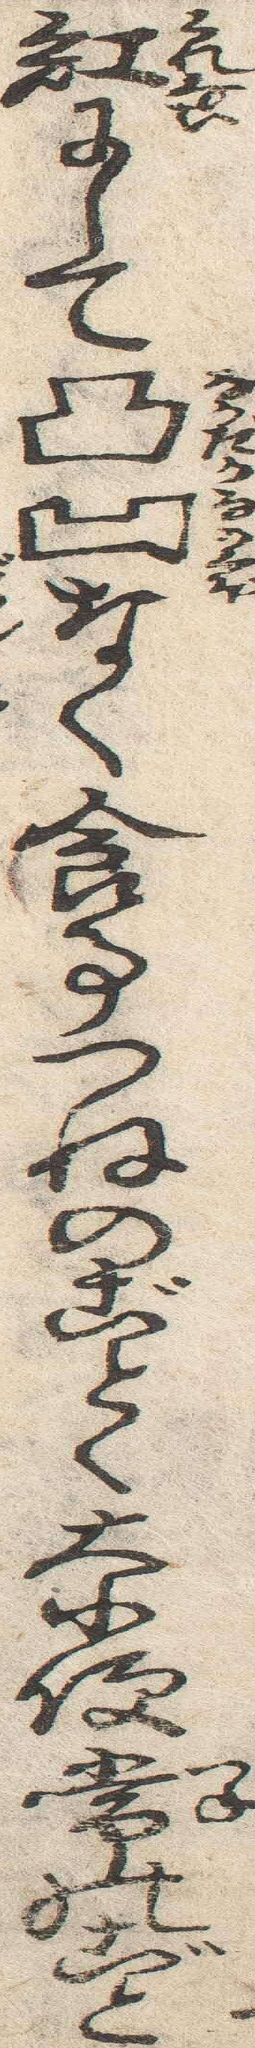紅にして凸凹なく食事つねのごとく大小便常のごと
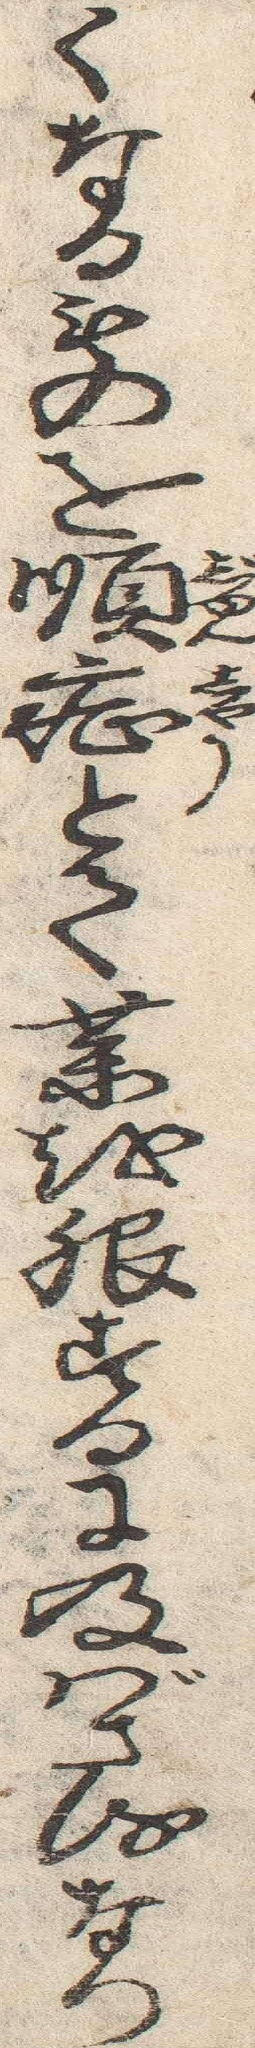くなるものを順症とて薬を服するに及ばさるなり
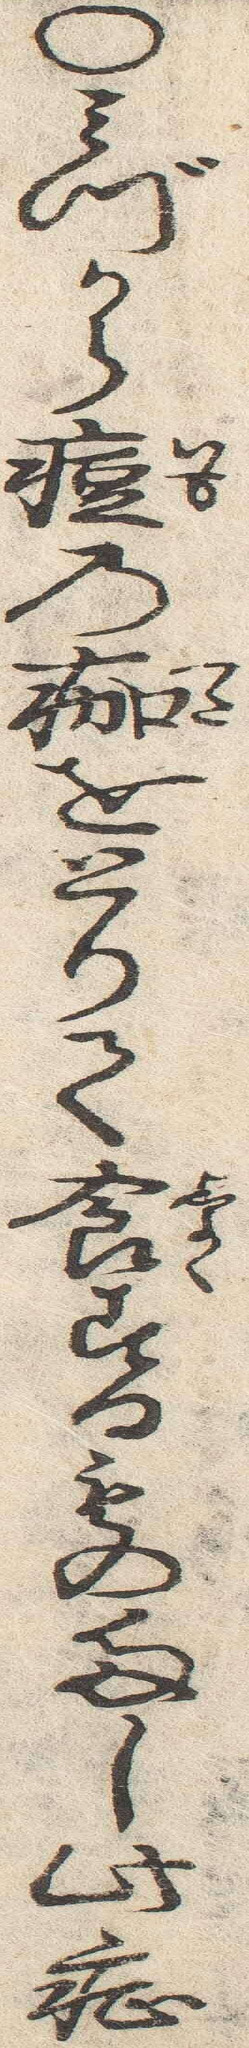○みづから痘の痂をとりて食するもの多し此症
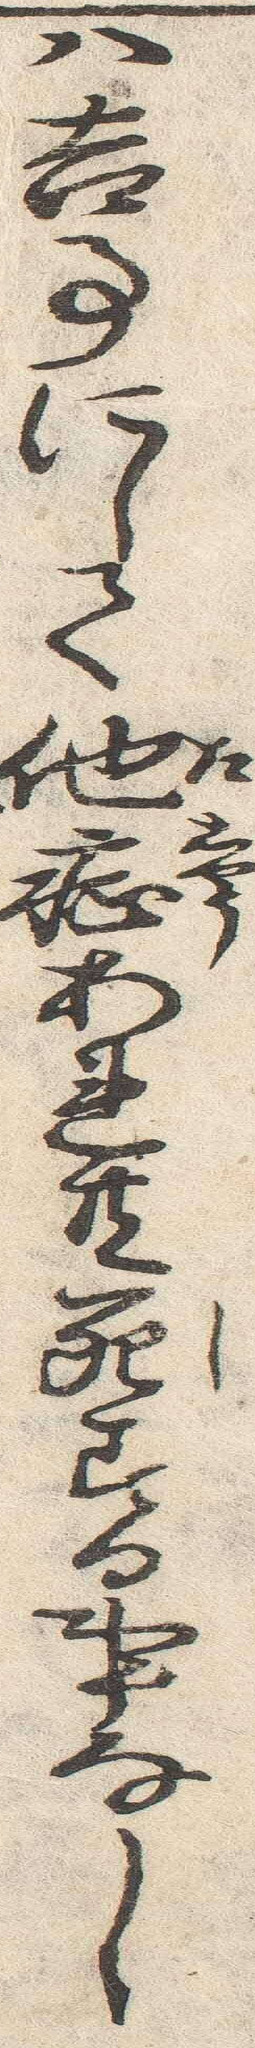は吉事にして他症あれ共死する事なし
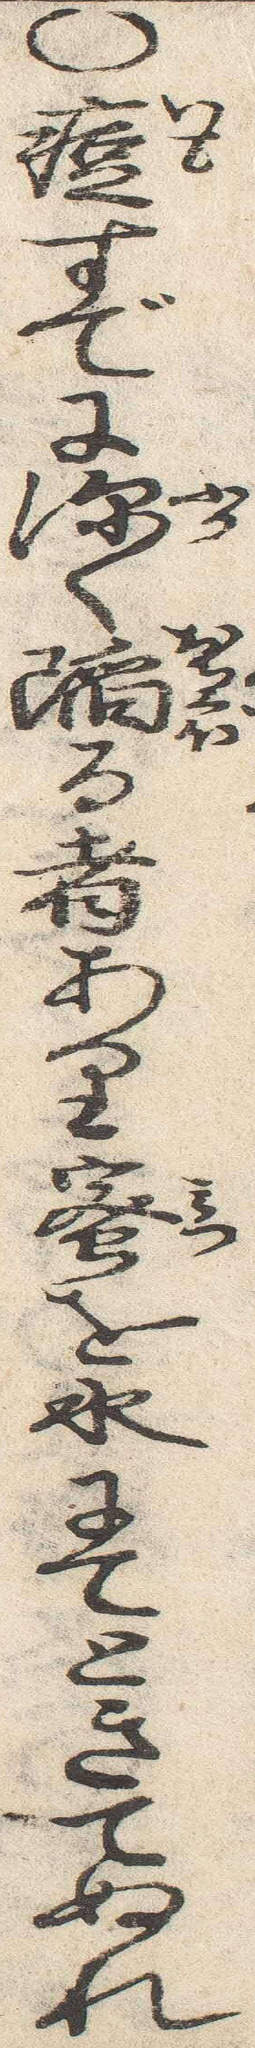○痘すでに深く陥る者あり蜜を水にてときてぬれ
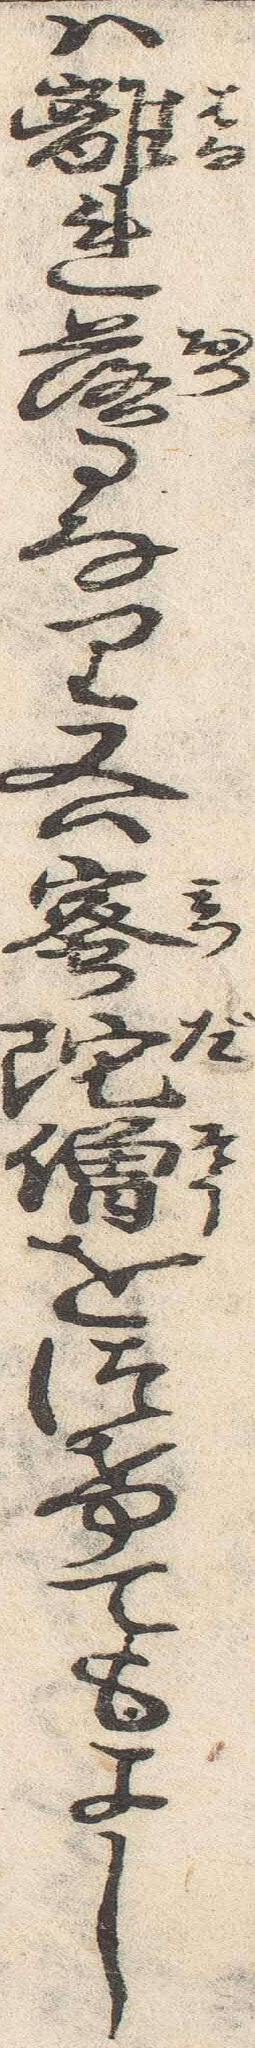は離れ落るなり又は蜜陀僧をつけてもよし
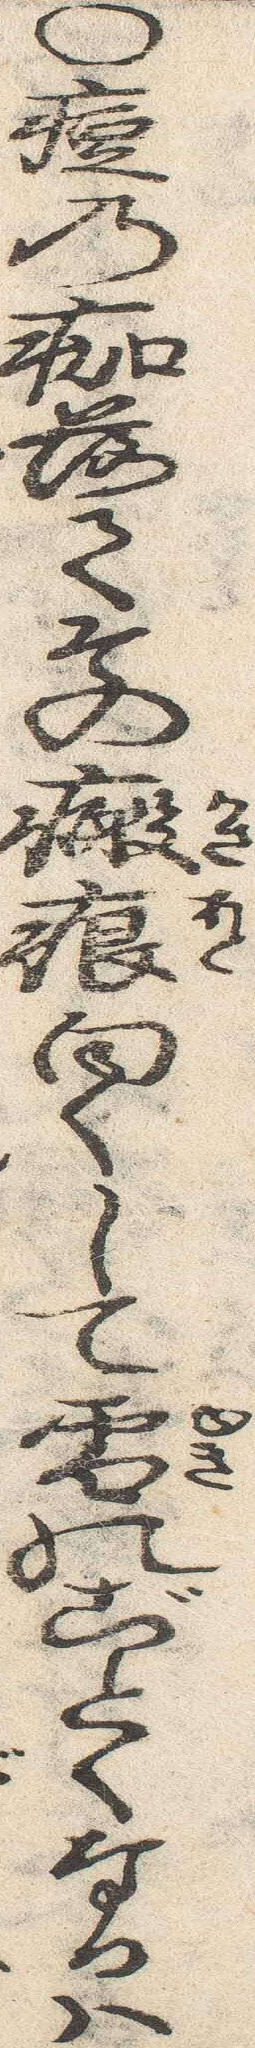○痘の痂落てその瘢痕白くして雪のごとくなるは
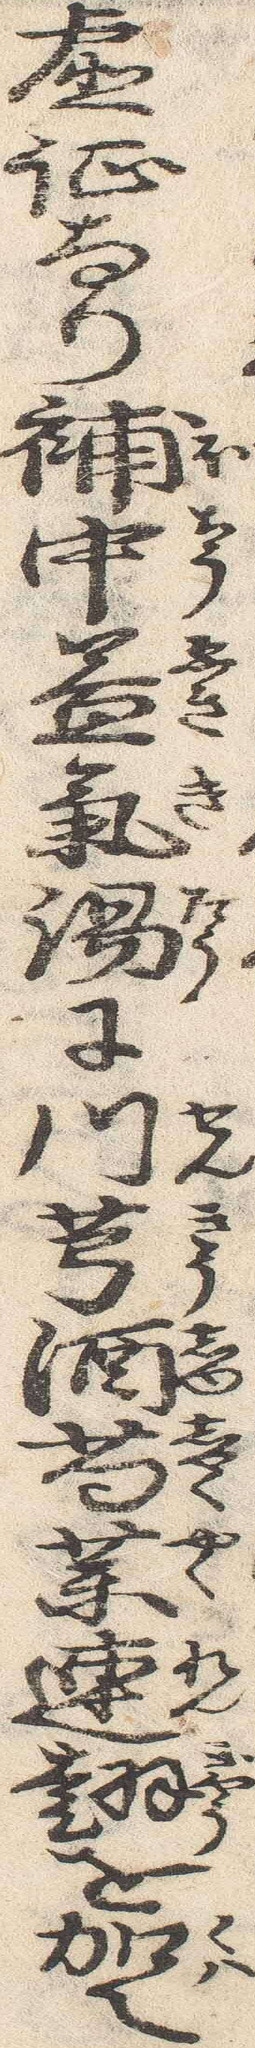虚証なり補中益気湯に川芎酒芍薬連翹を加え
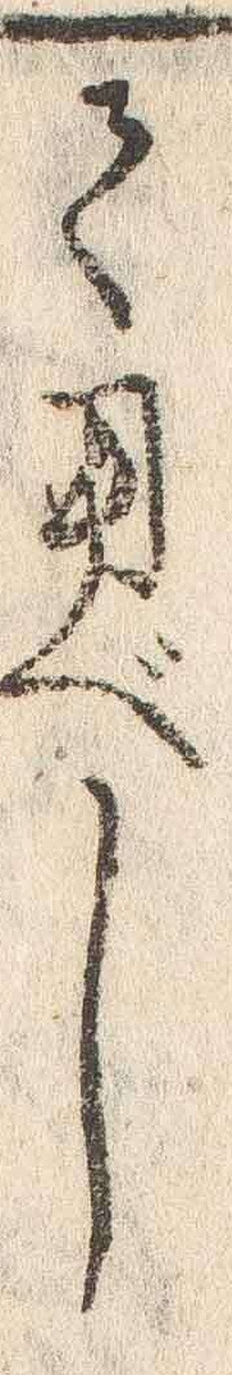て用べし
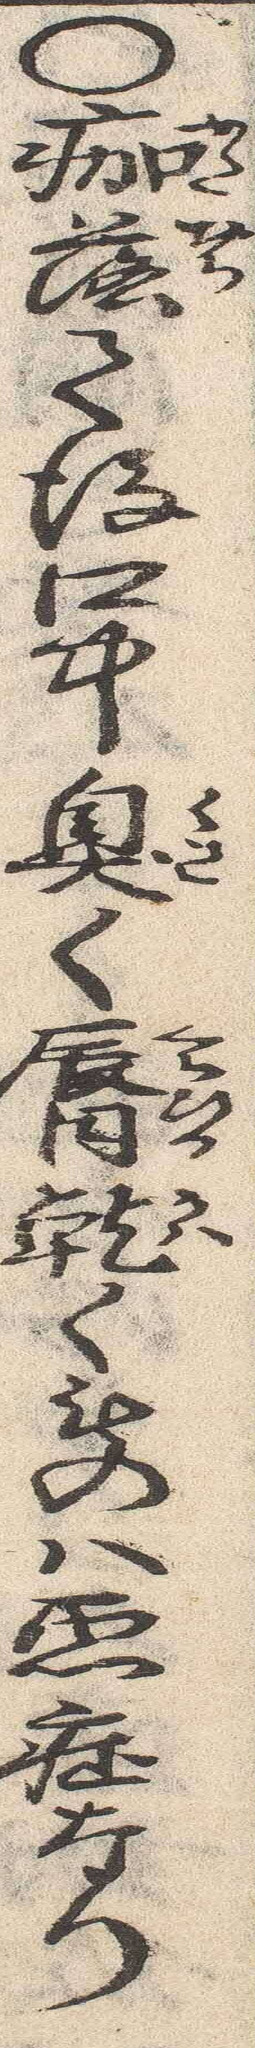○痂落て後口中臭く脣乾くものは悪症なり
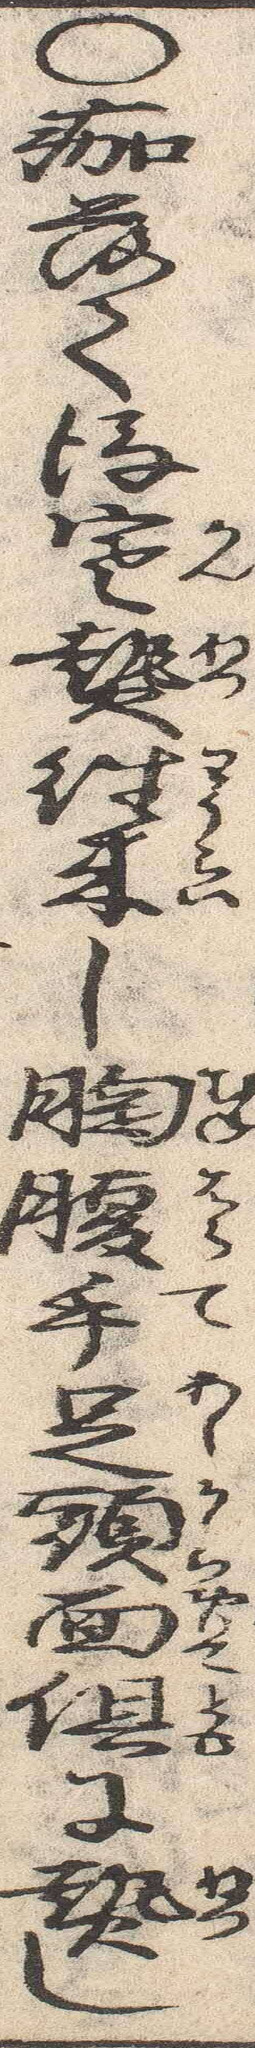○痂落て後寒熱往来し胸腹手足頭面倶に熱し
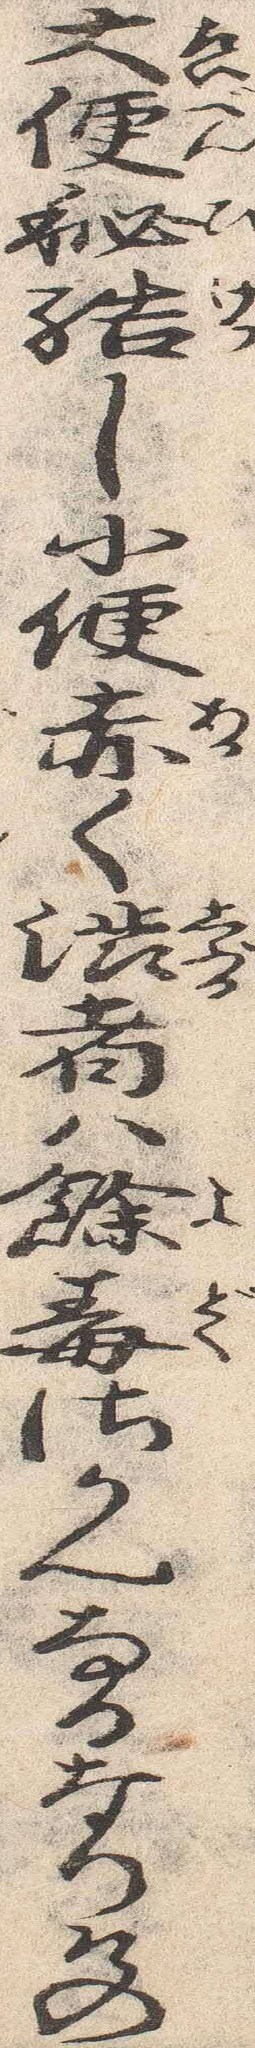大便秘結し小便赤く渋者は余毒さかんなるなりその
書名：小児必用養育草
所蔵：東京学芸大学附属図書館 国文学研究資料館
